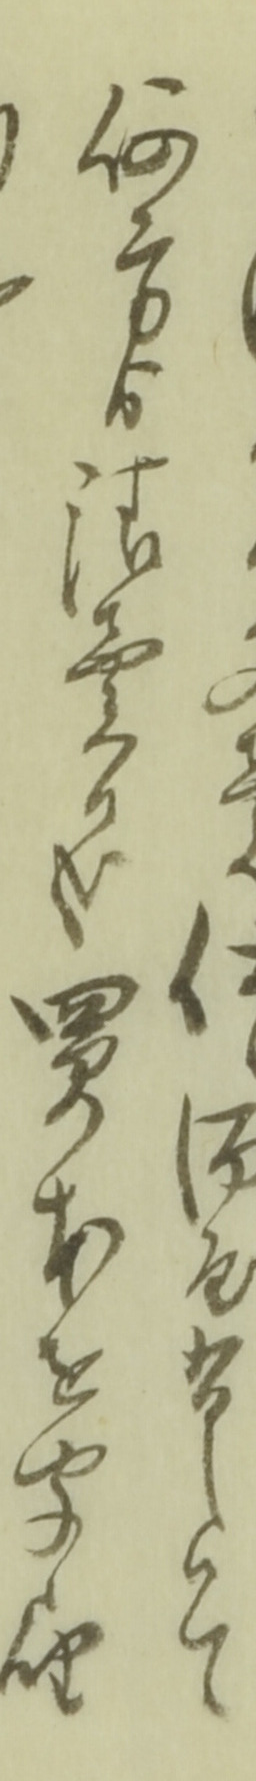何方ゟ請売候哉買本を聞届
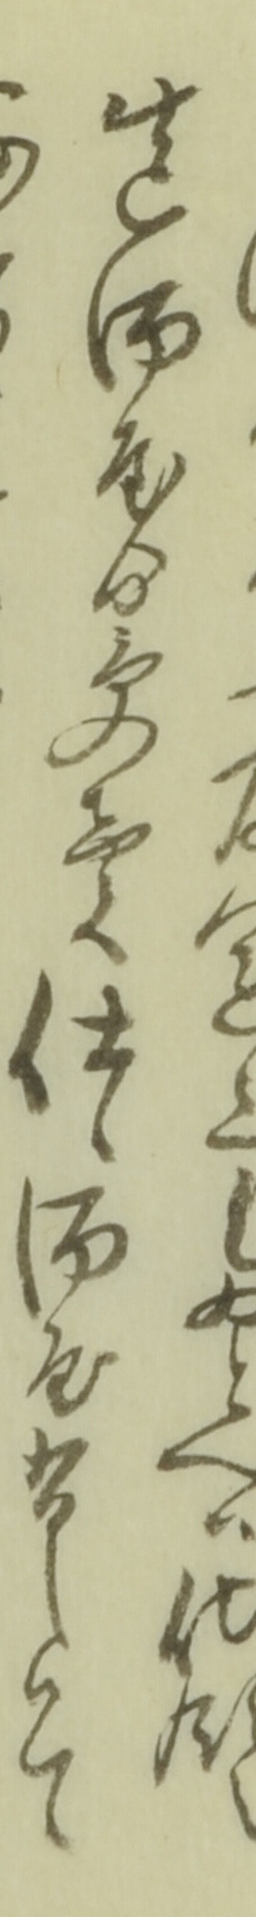造酒屋ゟ受売仕候酒屋有之候ハヽ
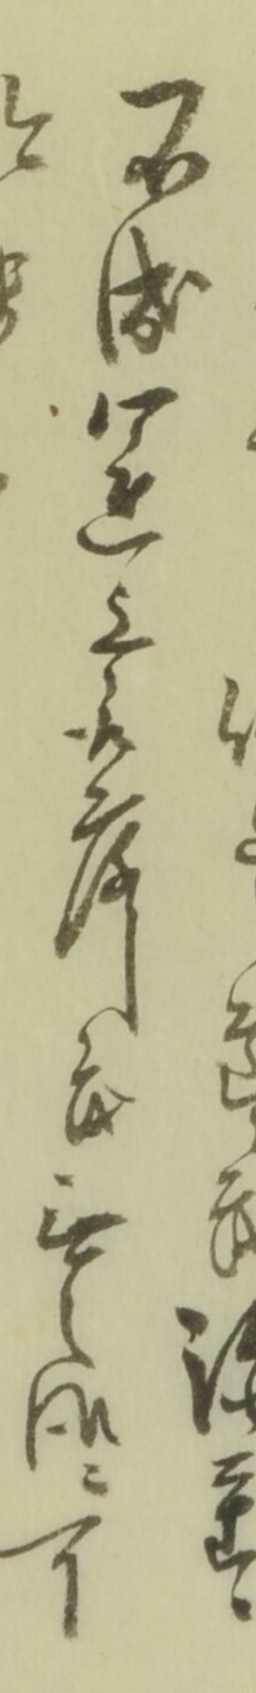不成運上取落し茂無之様ニ可
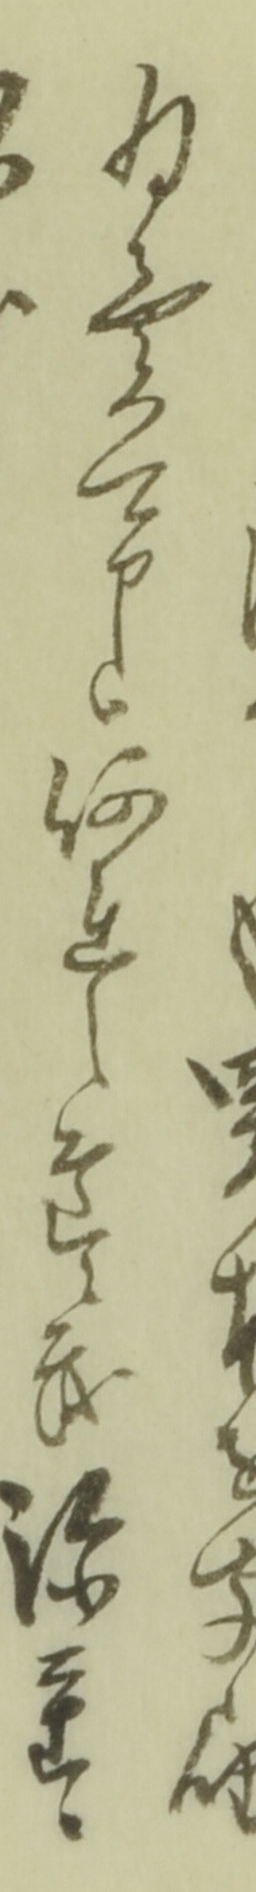為売可申候何れ之道ニ茂弥重ニ
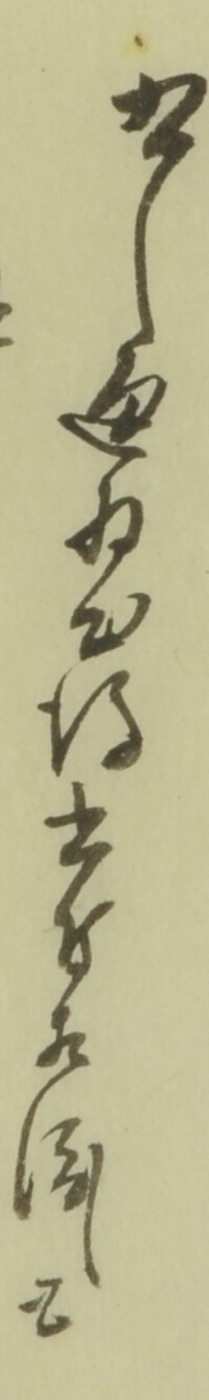右之通為心得書付相渡候以上
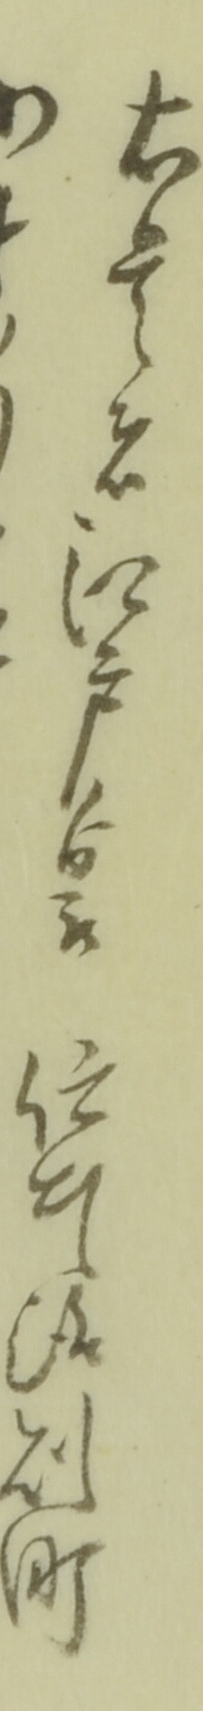右是者江戸ゟ被仰出候趣則町
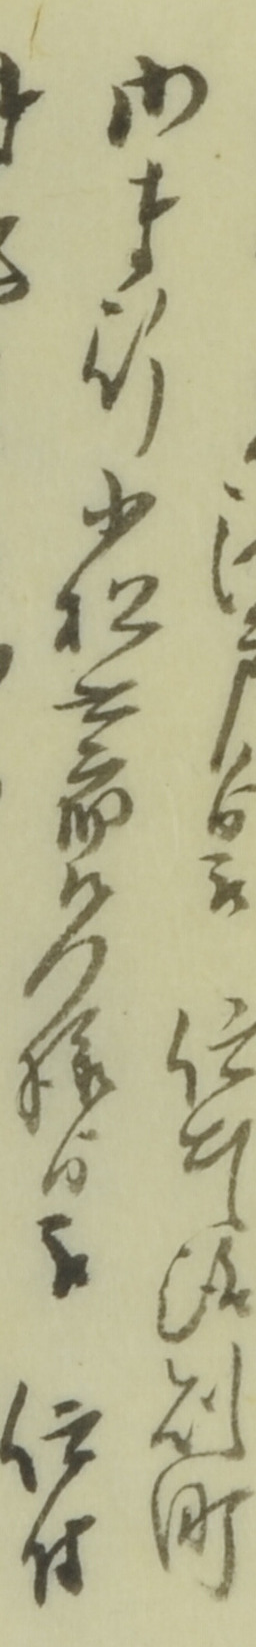御奉行小松六郎左衛門様ゟ被仰付
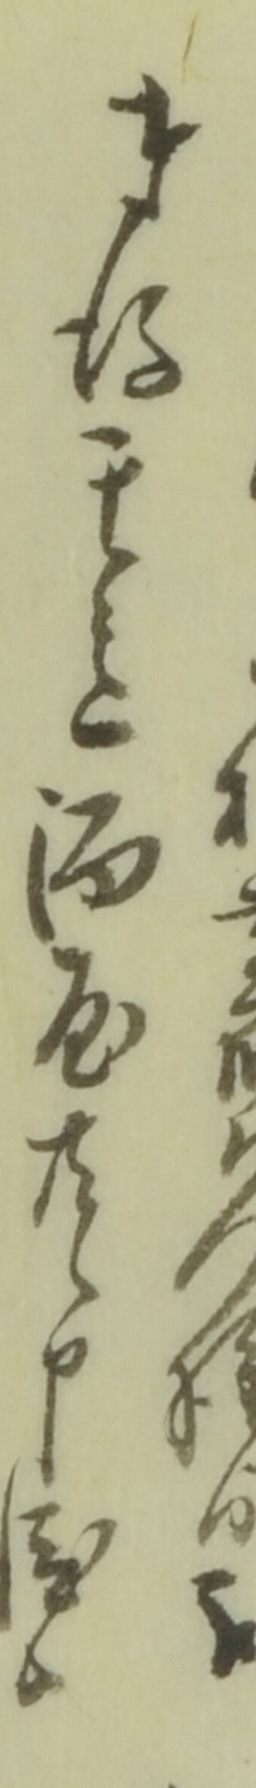奉得其意酒屋共へ申渡候

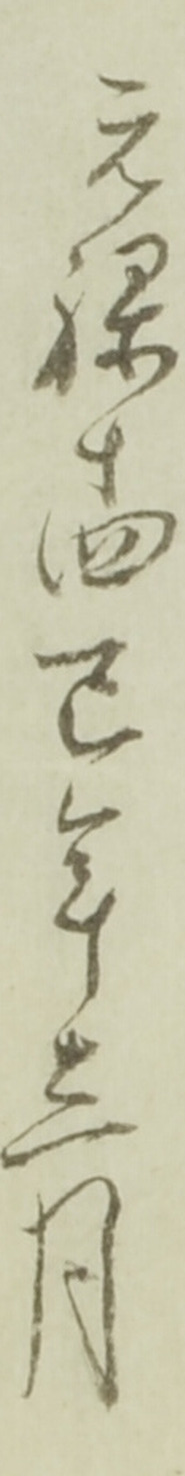元禄十四巳年十二月
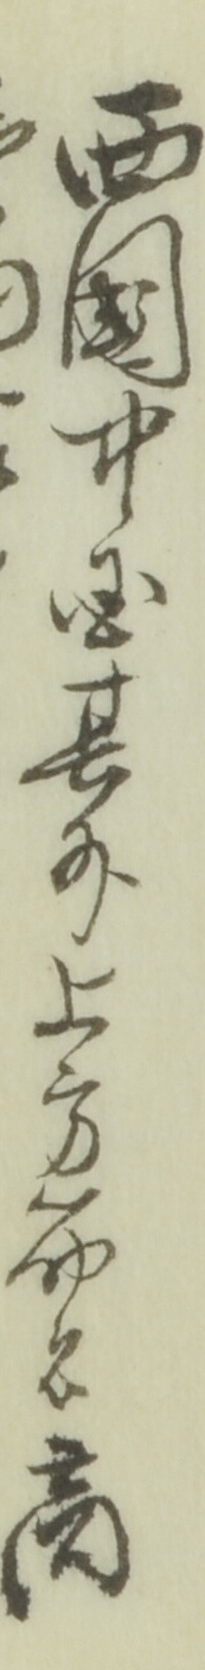西国中国其外上方筋者商
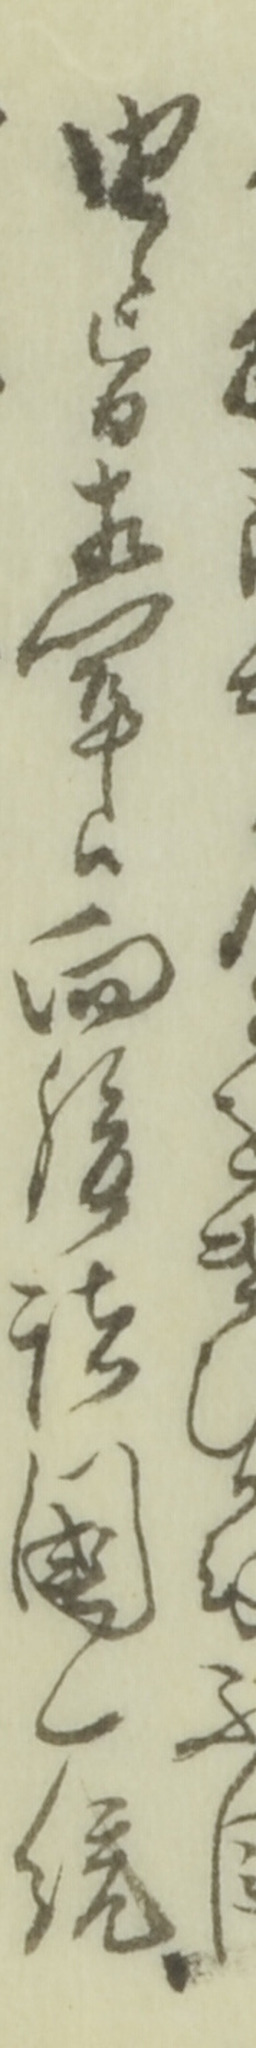由之旨相聞候向後諸国一統
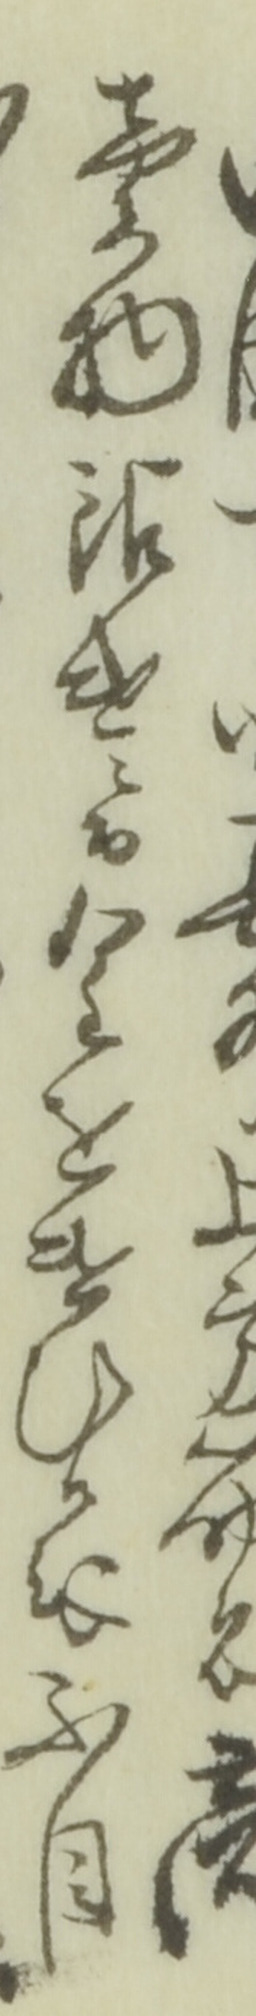売物銀遣ニ而金を遣ひ候義不自
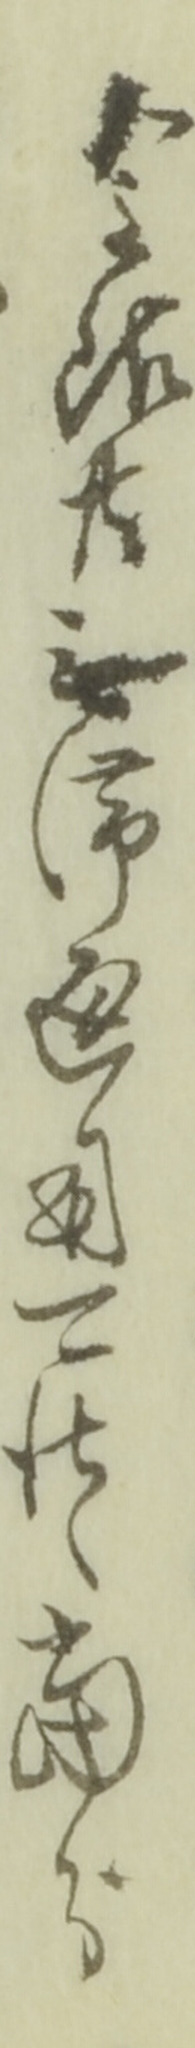金銀共無滞通用可仕候当分
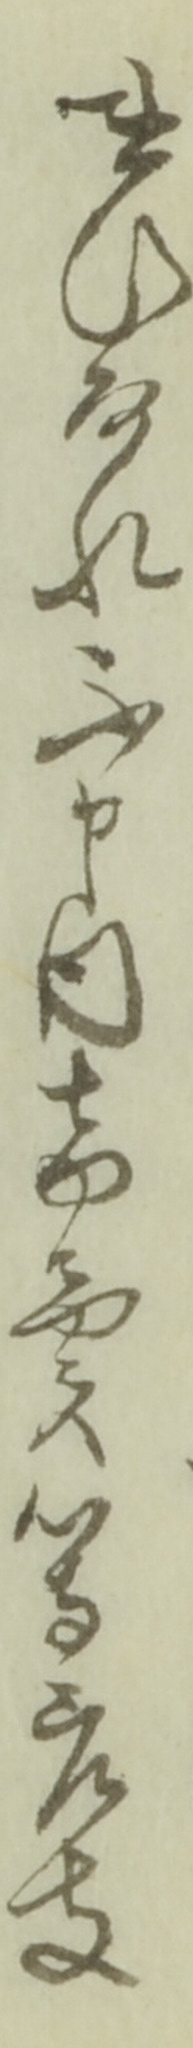遣ひなれ不申内商売等差支
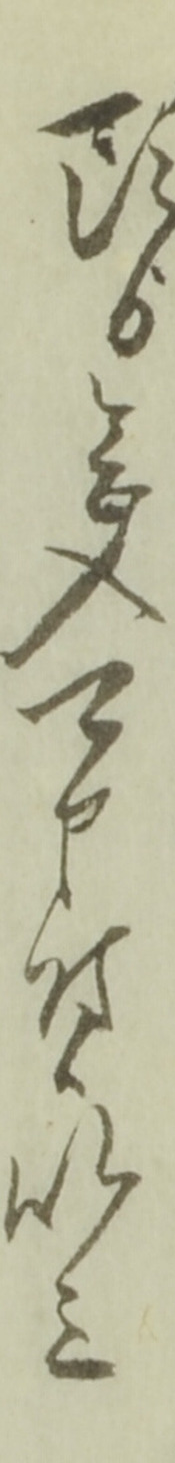頭ゟ念入可申付候以上
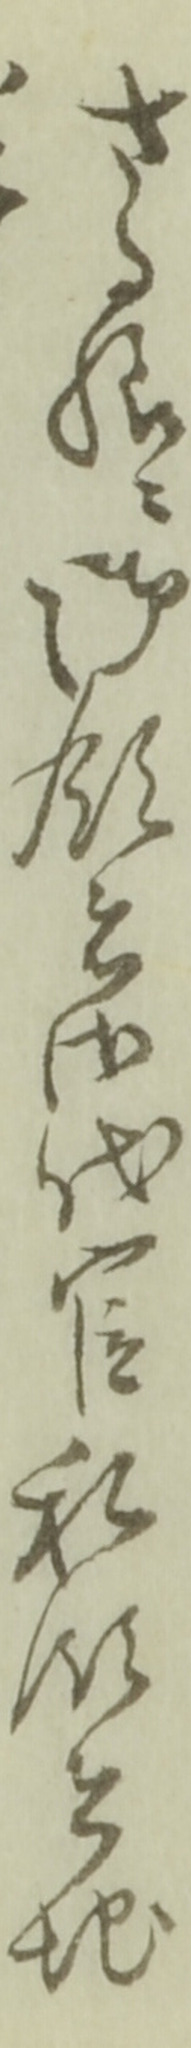さる様ニ御領者御代官私領者地
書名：御公儀様御領主様御触書控
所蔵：伊那市立高遠町図書館・合同会社AMANE
